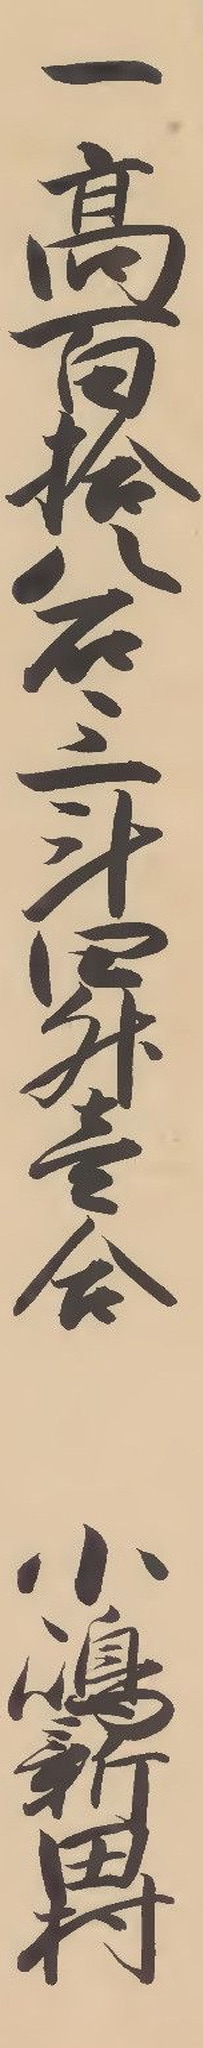一高百拾八石三斗四升壱合小島新田村
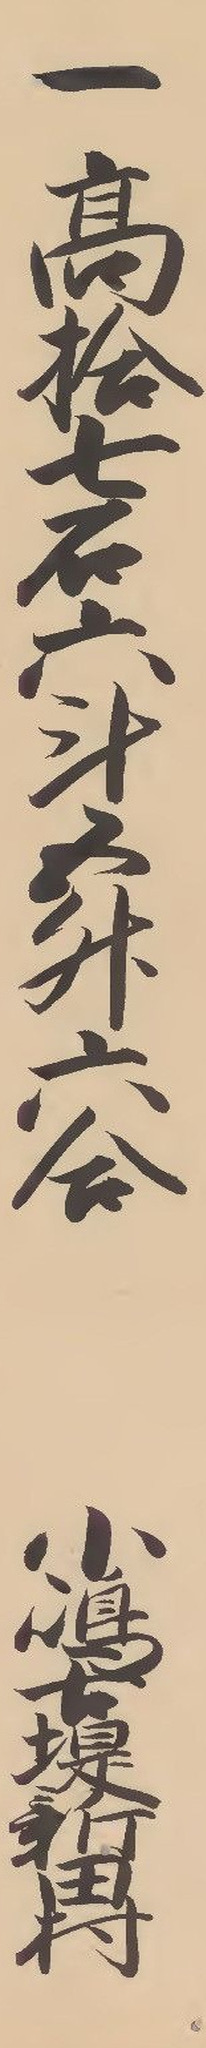一高拾七石六斗五升六合小島古堤新田村

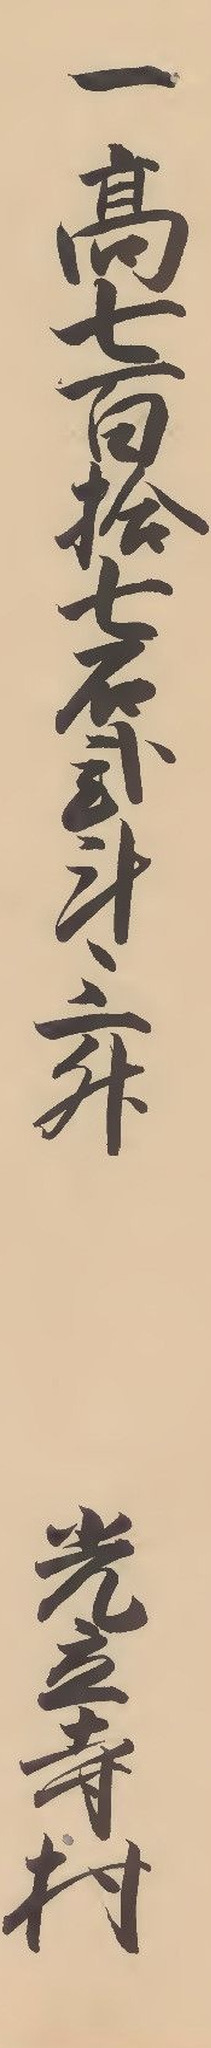一高七百拾七石弐斗三升光立寺村
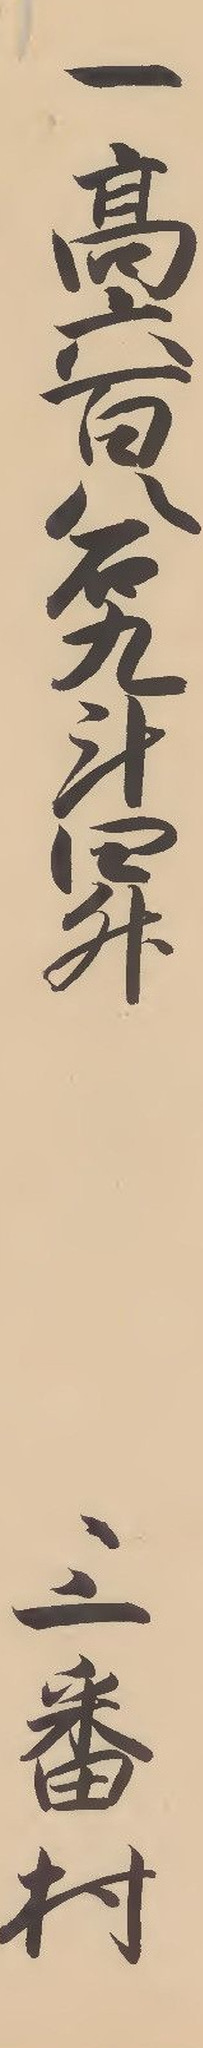一高六百八石九斗四升三番村
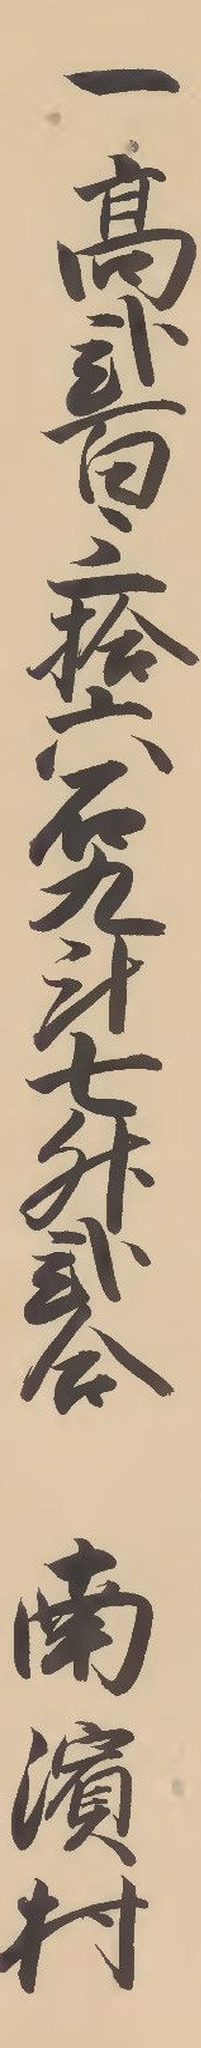一高弐百三拾六石九斗七升弐合南浜村
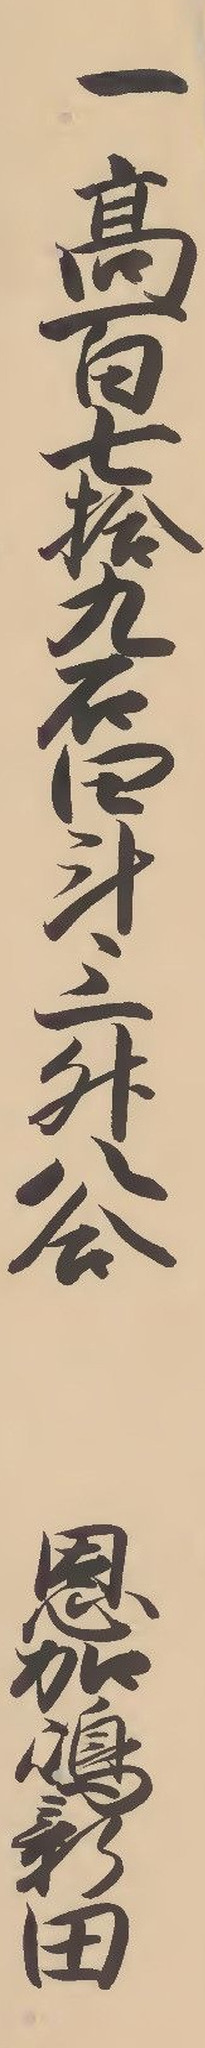一高百七拾九石四斗三升八合恩加島新田
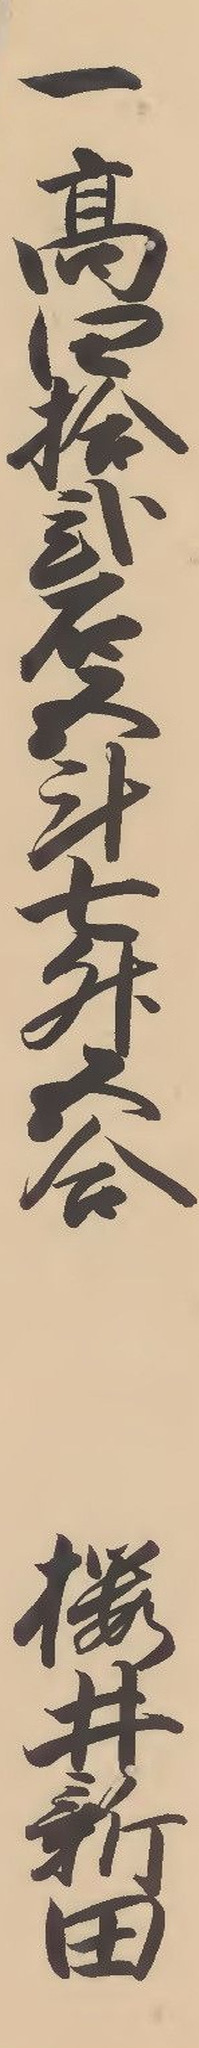一高四拾弐石五斗七升五合桜井新田
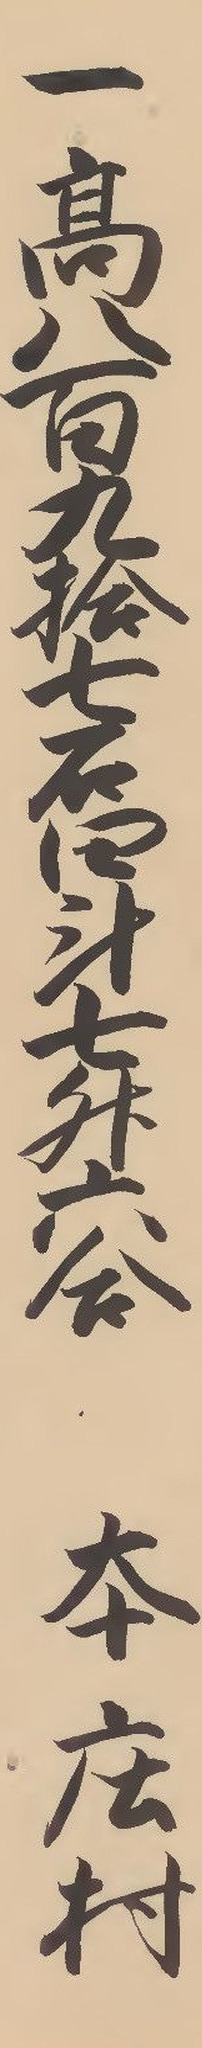一高八百九拾七石四斗七升六合本庄村
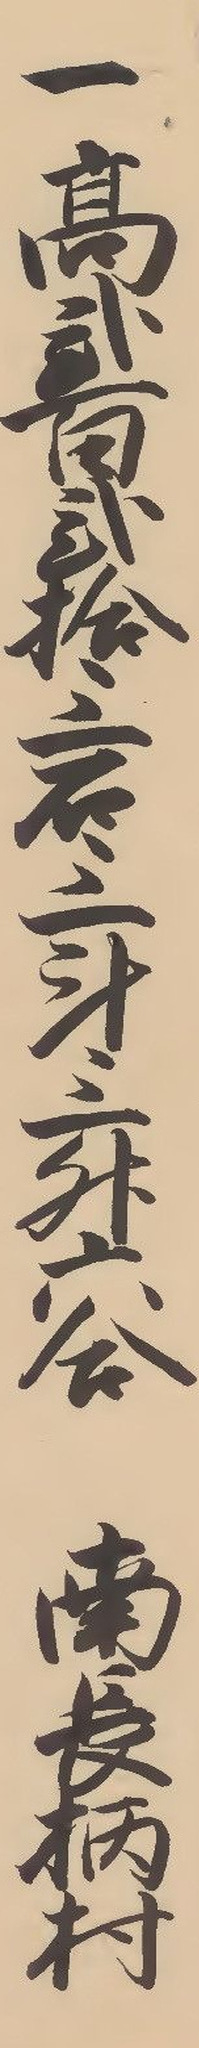一高弐百弐拾三石三斗三升六合南長柄村
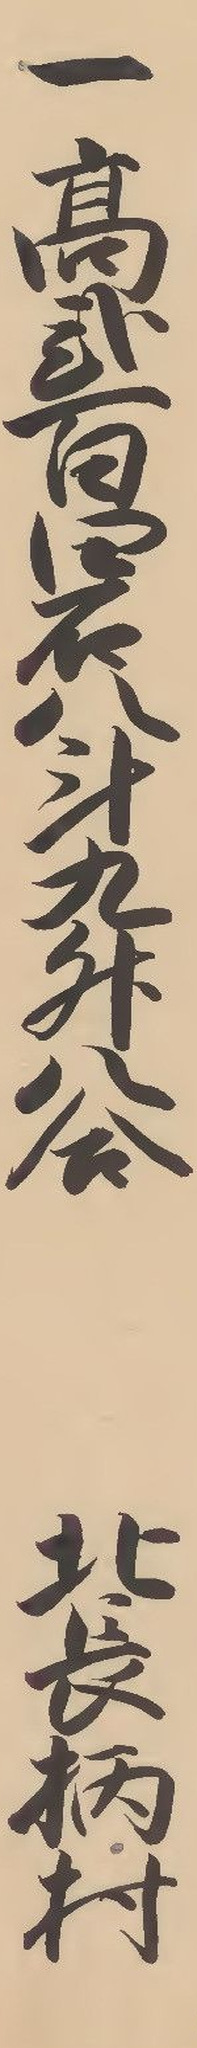一高弐百四石八斗九升八合北長柄村

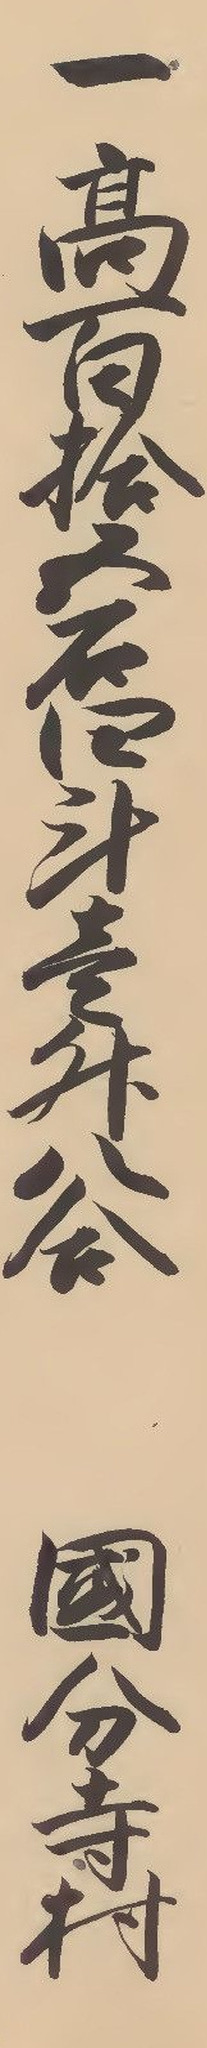一高百拾五石四斗壱升八合国分寺村
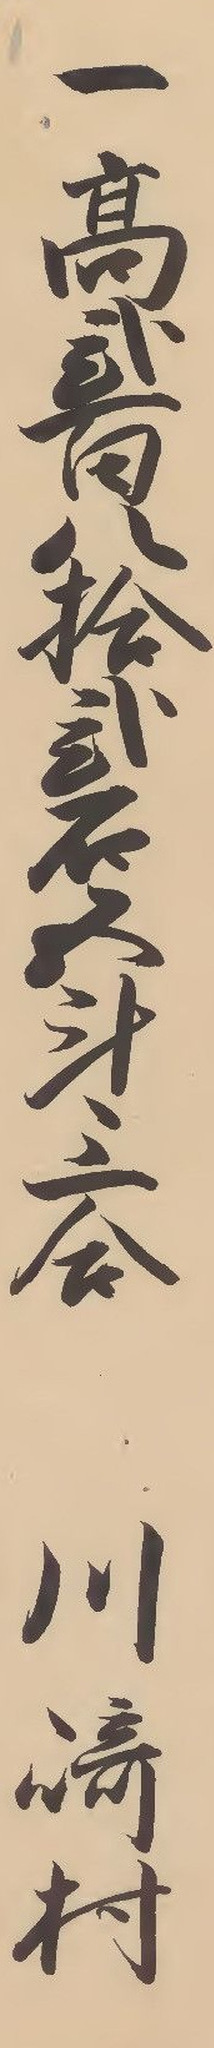一高弐百八拾弐石五斗三合川崎村
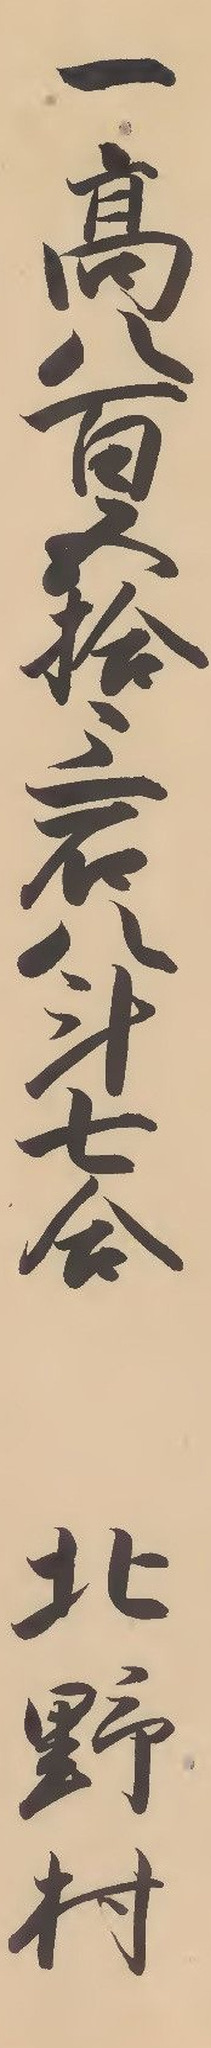一高八百五拾三石八斗七合北野村
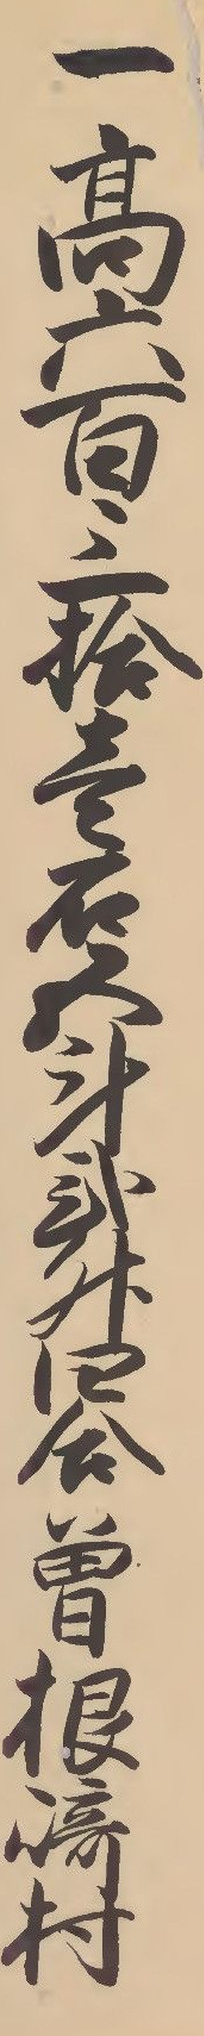一高六百三拾壱石五斗弐升四合曽根崎村
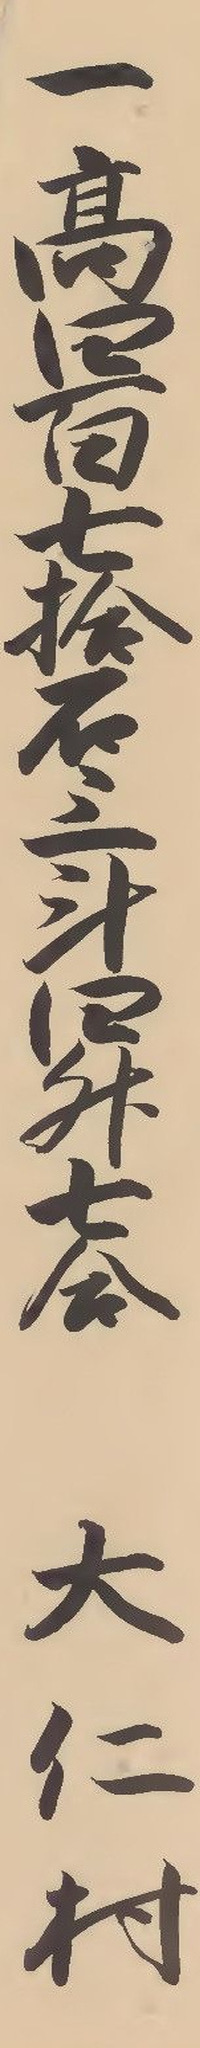一高四百七拾石三斗四升七合大仁村
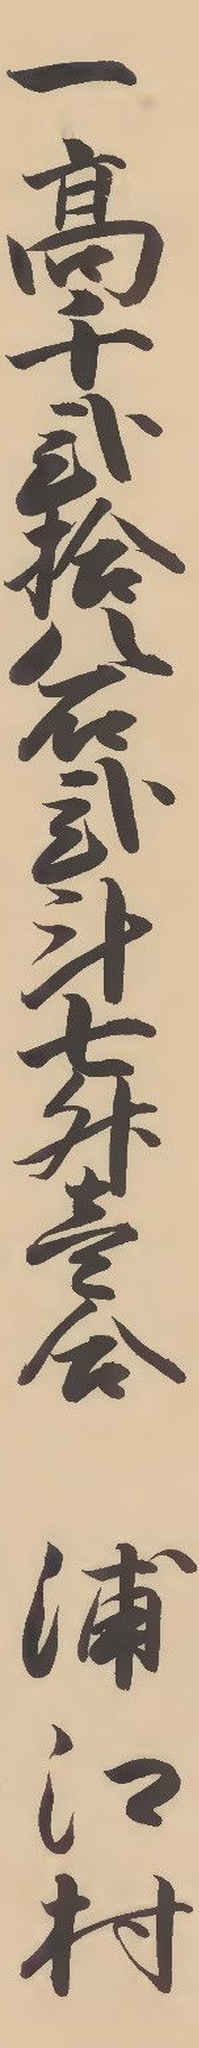一高千弐拾八石弐斗七升壱合浦江村
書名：摂津国郷帳
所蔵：国立公文書館 National Archives of Japan
